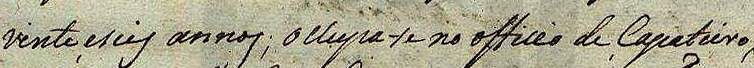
vinte, e seis annos; occupa-se no officio de Çapateiro,
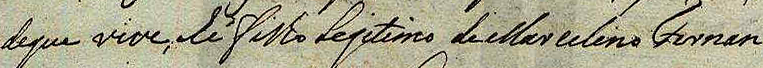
de que vive, he filho Legitimo de Marcelino Fernan
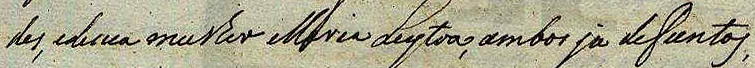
des, e de sua mulher Maria Leytoa, ambos ja defuntos,
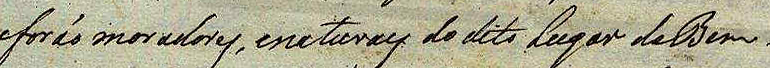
foraõ moradores, e naturaes do dito Lugar de Bem
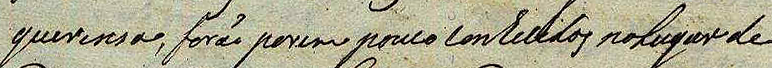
querensa, foraõ porem pouco conhecidos no Lugar de
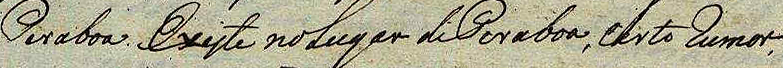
Peraboa. Existe no Lugar de Peraboa, certo Rumor,
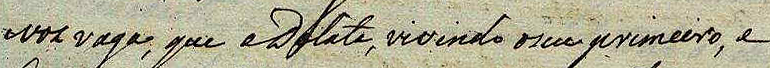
e voz vaga, que a Delata, vivendo o seu primeiro, e
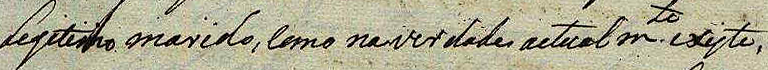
Legitimo marido, como na verdade actualmte. existe,
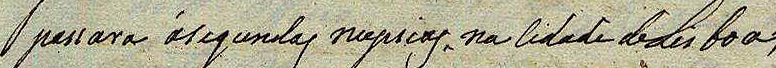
passara á segundas nupsias na cidade de Lisboa,
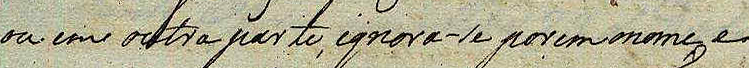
ou em outra parte, ignora-se porem o nome, e
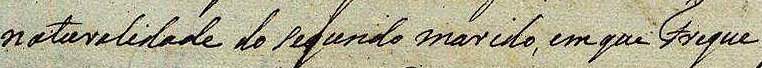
naturalidade do segundo marido, em que Fregue
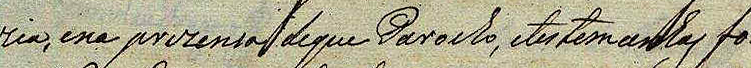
zia, e na prezensa de que parocho, testemunhas fo
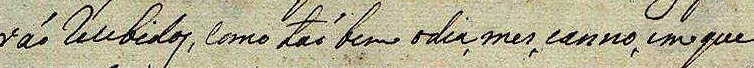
raõ Recebidas, como taõ bem o dia, mes, e anno, em que
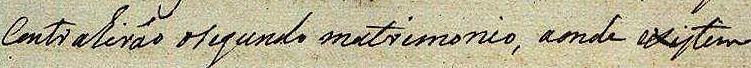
contrahiraõ o segundo matrimonio, aonde existem
